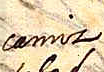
camiz
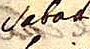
sabad
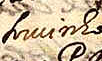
toucinho
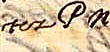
rez P N
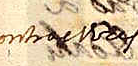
outras vozes
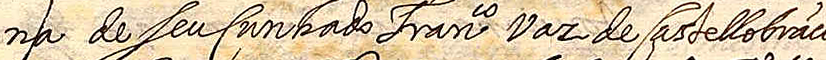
na de seu Cunhado Franco vaz de Castello brāco
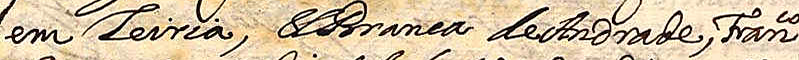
em Leiria, & Branca de Andrade, Franco
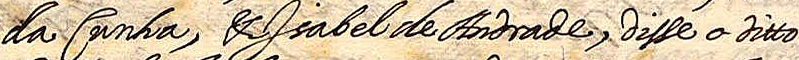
da Cunha, & Jsabel de Andrade, disse o ditto
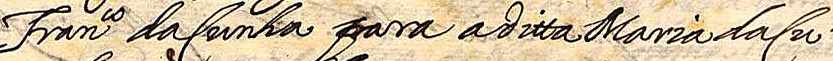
Franco da Cunha para a ditta Maria da Cu
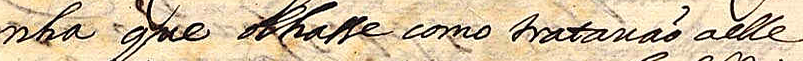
nha que olhasse como tratauaõ a elle
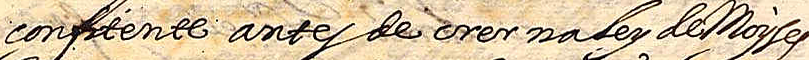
confitente antes de crer na Ley de Moyses
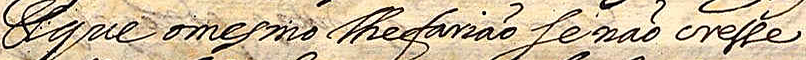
& que o mesmo lhe fariaõ se naõ cresse
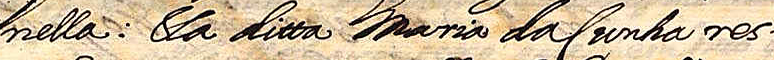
nella: & a ditta Maria da Cunha res
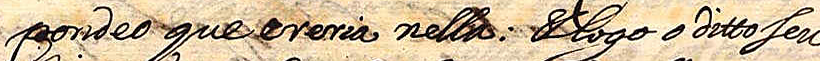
pondeo que creria nella: & logo o ditto seu
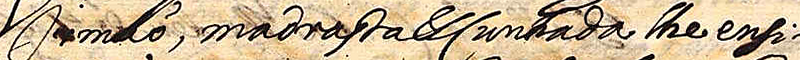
Jrmaõ, madrasta & Cunhada lhe ensi
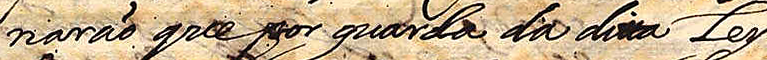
naraõ que por guarda da ditta Ley
